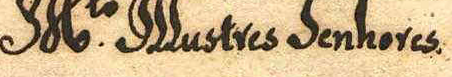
M.to Illustres Senhores.
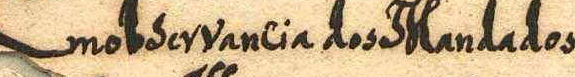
Em observancia dos Mandados
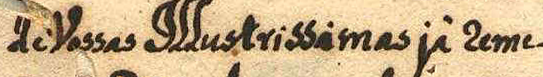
de Vossas Illustrissimas já Reme
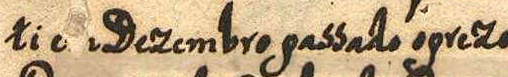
ti e_ Dezembro passado o prezo
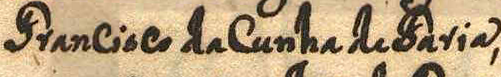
Francisco da Cunha de Faria;
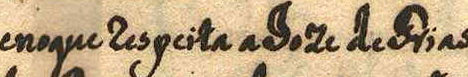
e no que Respeita a Ioze de Frias
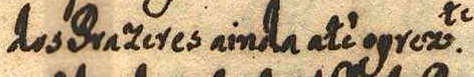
dos Prazeres ainda até o prez.te
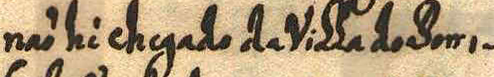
naõ hé chegado da Villa do Pom
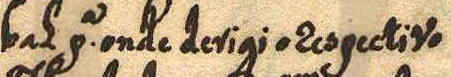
bal p.a onde derigi o Respectivo
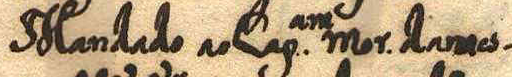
Mandado ao Cap.am mor da mes
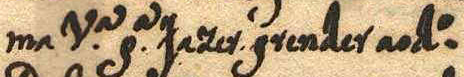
ma V.a p.a fazer prender ao d.o
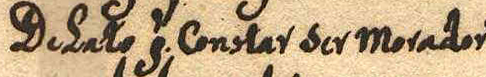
Delato p̄ constar ser morador
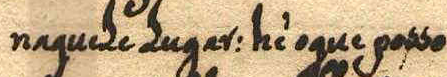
naquele lugar: hé o que posso
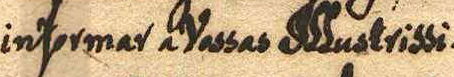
informar a Vossas Illustrissi
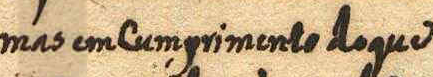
mas em cumprimento do que
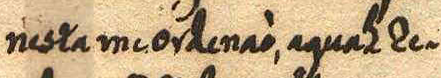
nesta me ordenaõ, a qual Re
